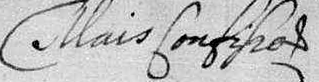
Mais Confissaõ
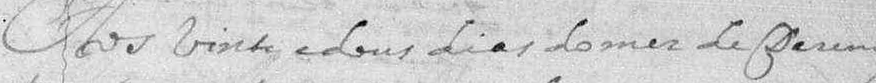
Aos vinte e dous dias do mez de Dezem
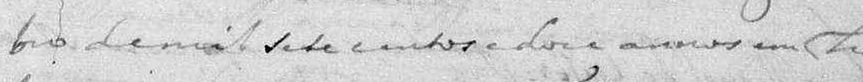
bro de mil setecentos e doze annos em Lis
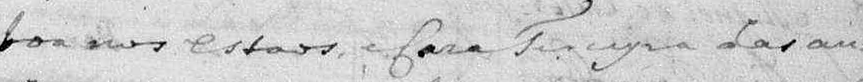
boa nos estaos, e Caza Terceyra das au
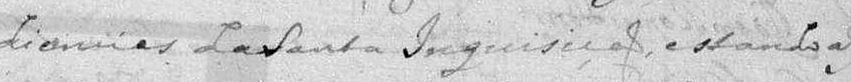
diencias da santa Inquisiçaõ, estando ahy
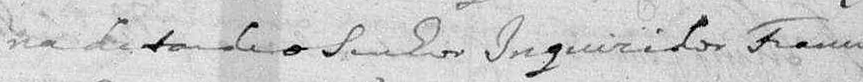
na de tarde o Senhor Inquizidor Francis
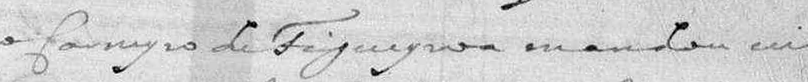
co Carneyro de Figueyroa mandou uir
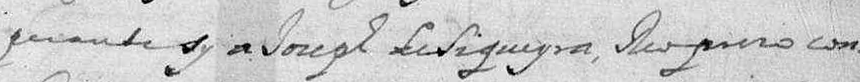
perante sy a Iozeph de siqueyra, Reo prezo con
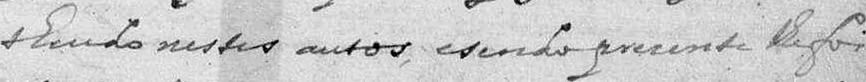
theudo nestes autos, e sendo prezente lhe foi
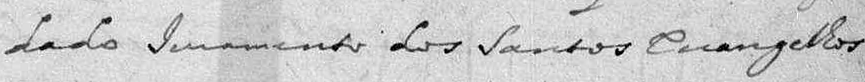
dado Iuramento dos santos euangelhos
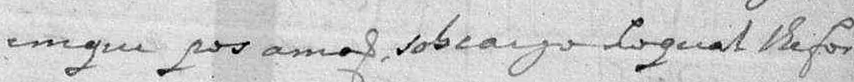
em que pos a maõ sob cargo do qual lhe foi
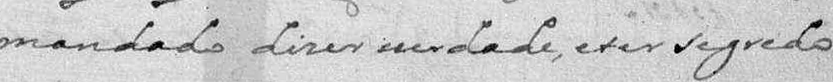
mandado dizer uerdade, e ter segredo
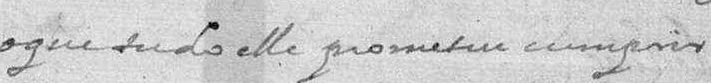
o que tudo elle prometeu cumprir.
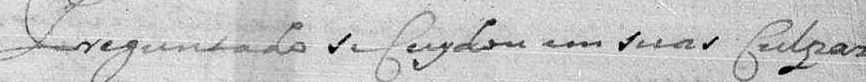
Preguntado se Cuydou em suas Culpaz
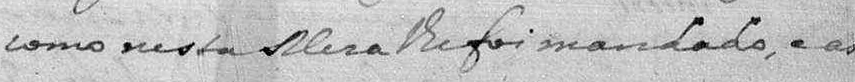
como nesta Meza lhe foi mandado, e as
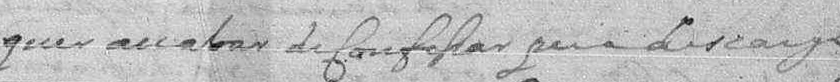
quer accabar de Confessar pera descargo
